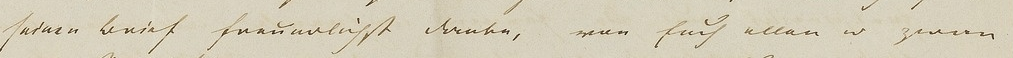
seinen Brief freundlichst danke, von Euch allen & zwar
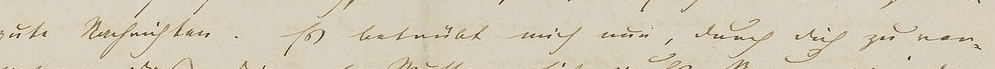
gute Nachrichten. Es betrübt mich nun, durch Dich zu ver-
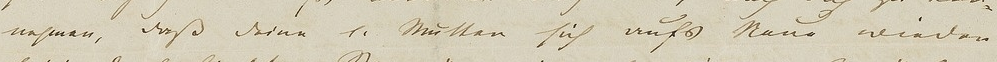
nehmen, daß deine l. Mutter sich aufs Neue wieder
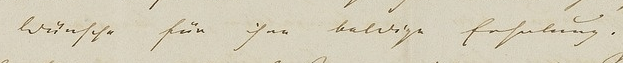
Wünsche für ihre baldige Erholung.
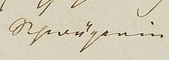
Schwägerin.
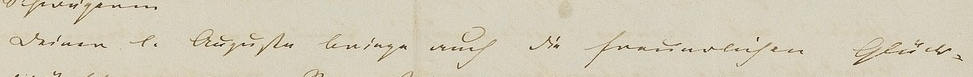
Deiner l. Auguste bringe auch die freundlichen Glück-
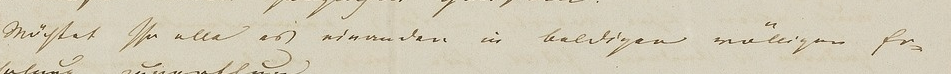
Möchtet Ihr alle es einander in baldiger völliger Er-
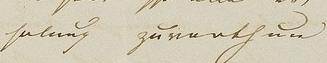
holung zuvorthun.
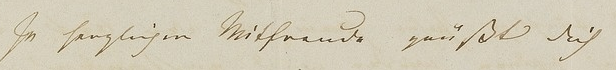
In herzlicher Mitfreude grüßt dich
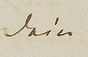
Dein
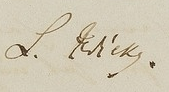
L. Zwicky.
